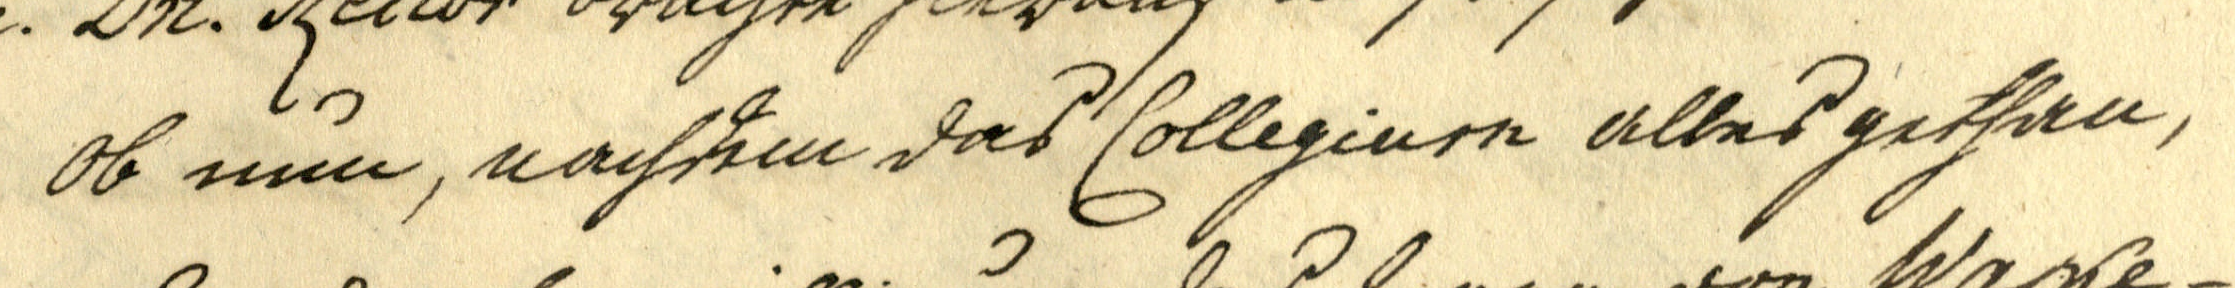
ob nun, nachdem das Collegium alles gethan,
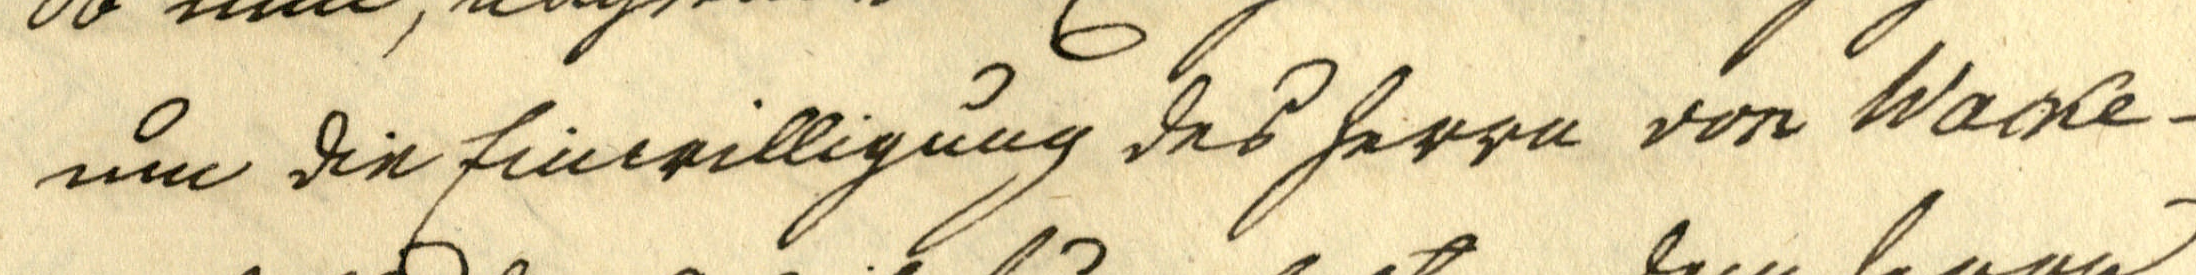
um die Einwilligung des Herrn von Wacke¬
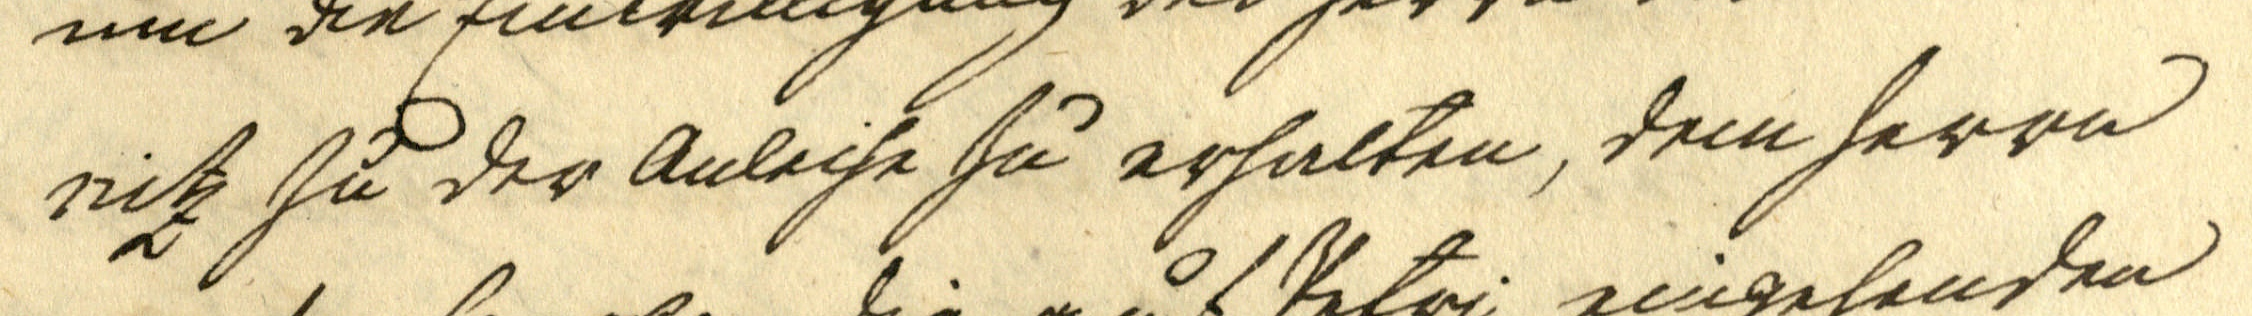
nitz zu der Anleihe zu erhalten, dem Herrn
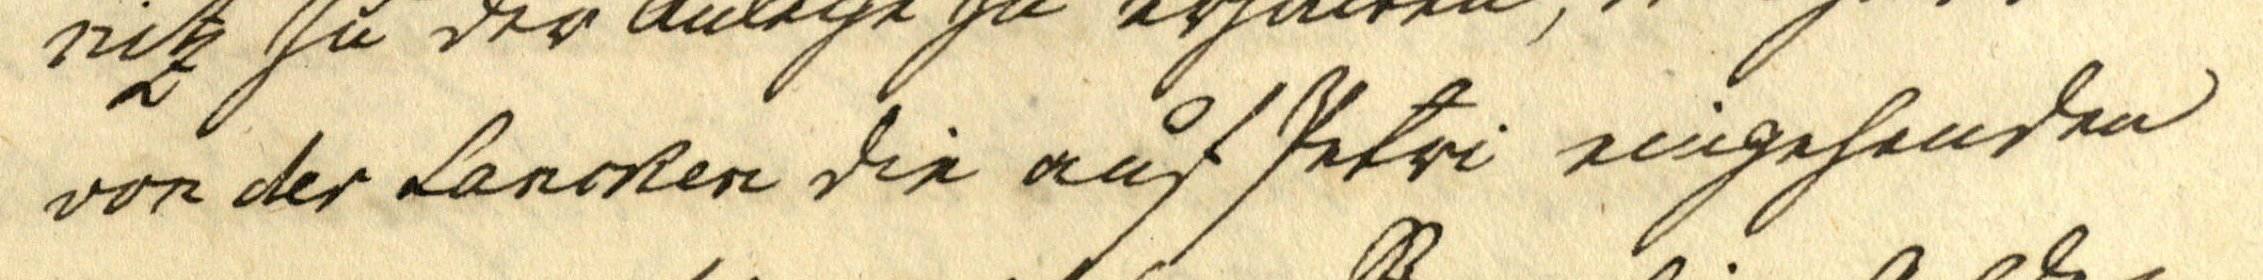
von der Lancken die auf Petri eingehenden
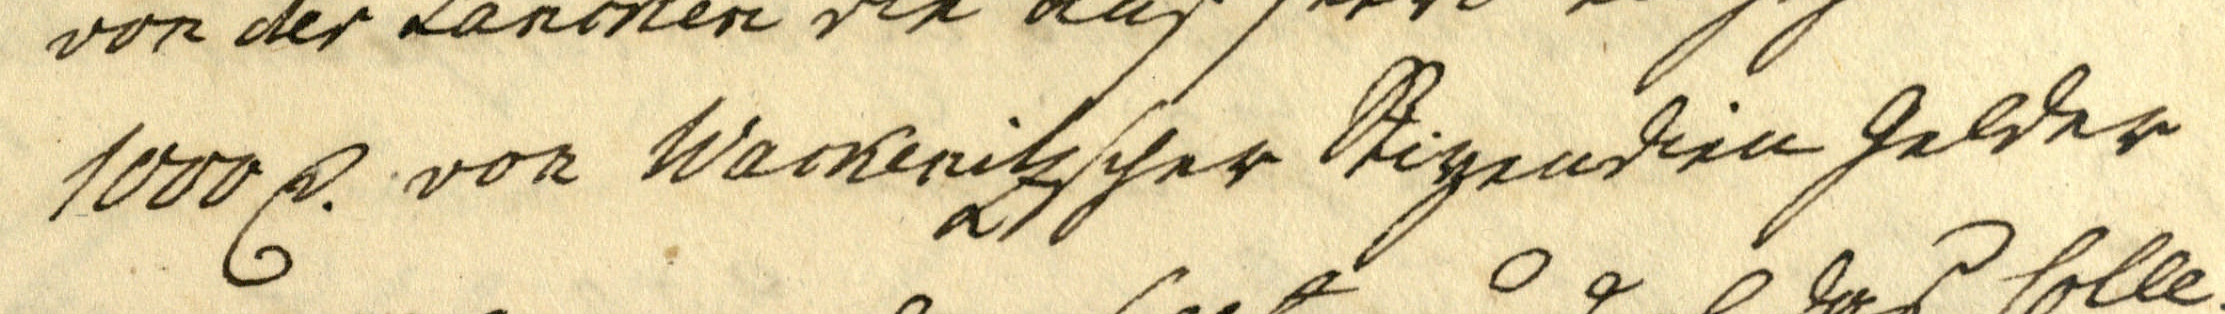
1000 l. von Wackenitzischer Stipendien Gelder
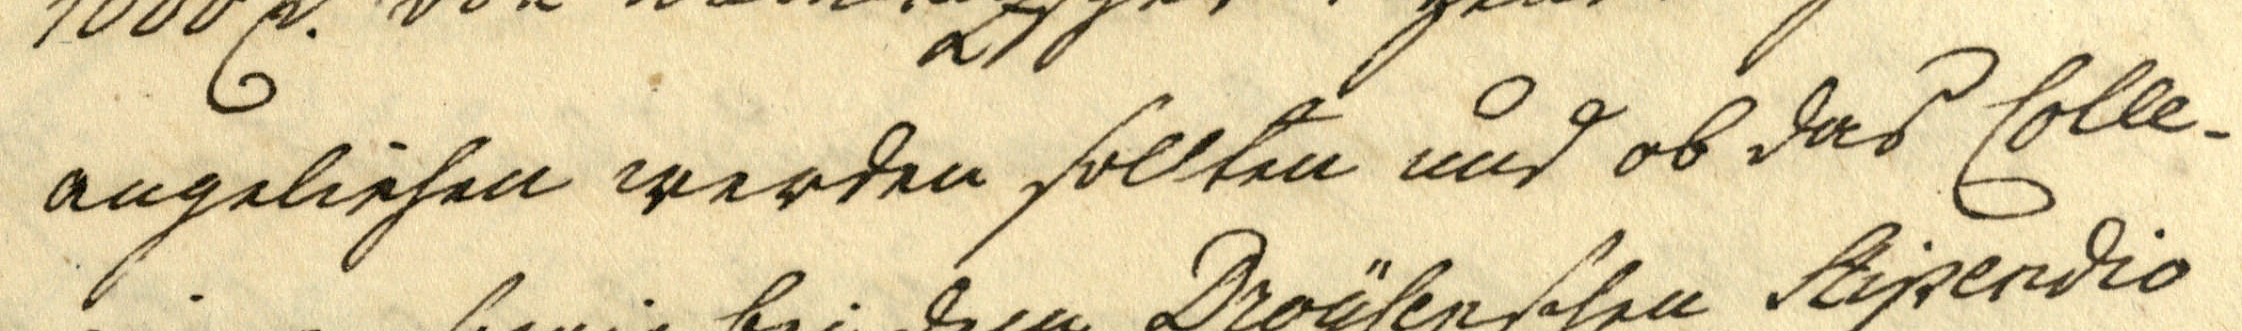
angeliehen werden sollten und ob das Colle¬
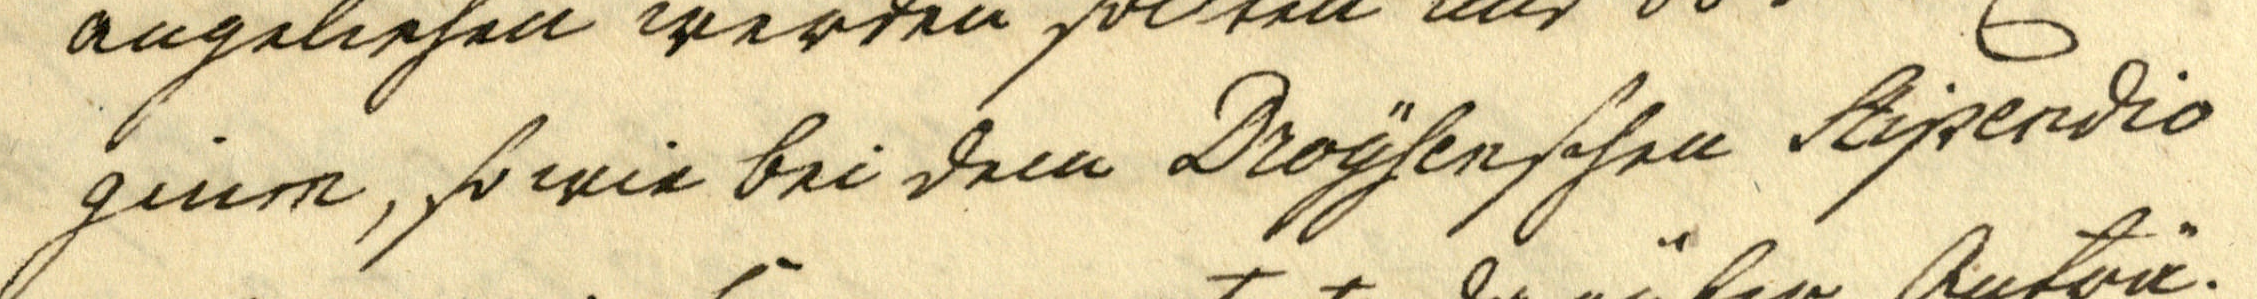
gium, so wie bei dem Droÿsenschen Stipendio
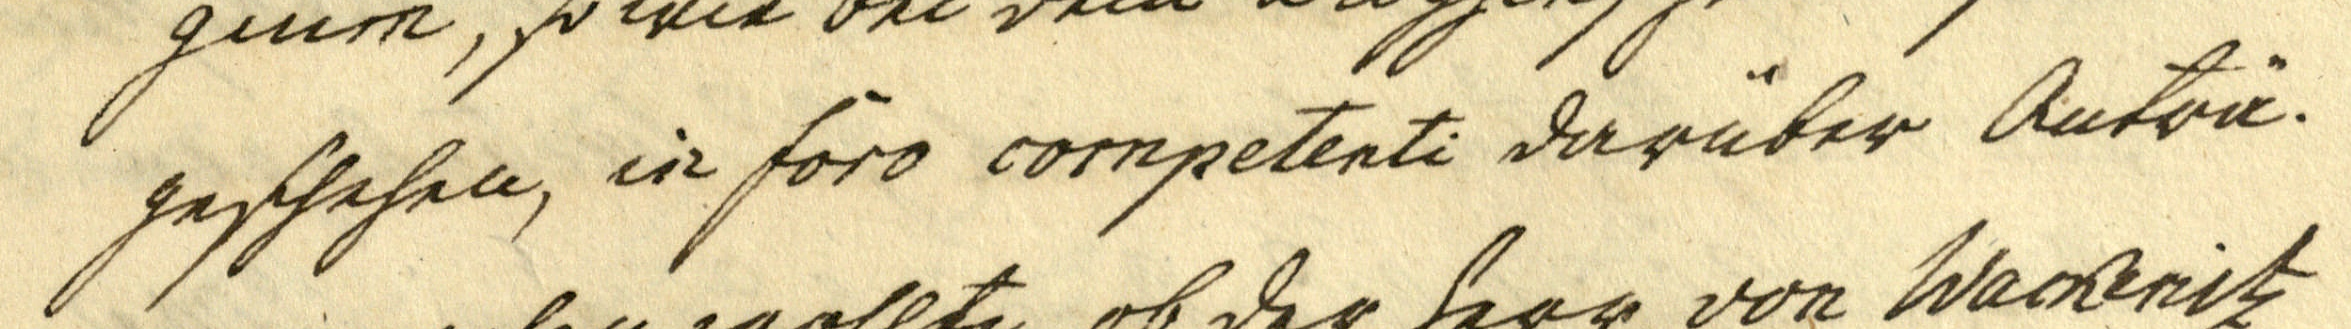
geschehen, in foro competenti darüber Anträ¬
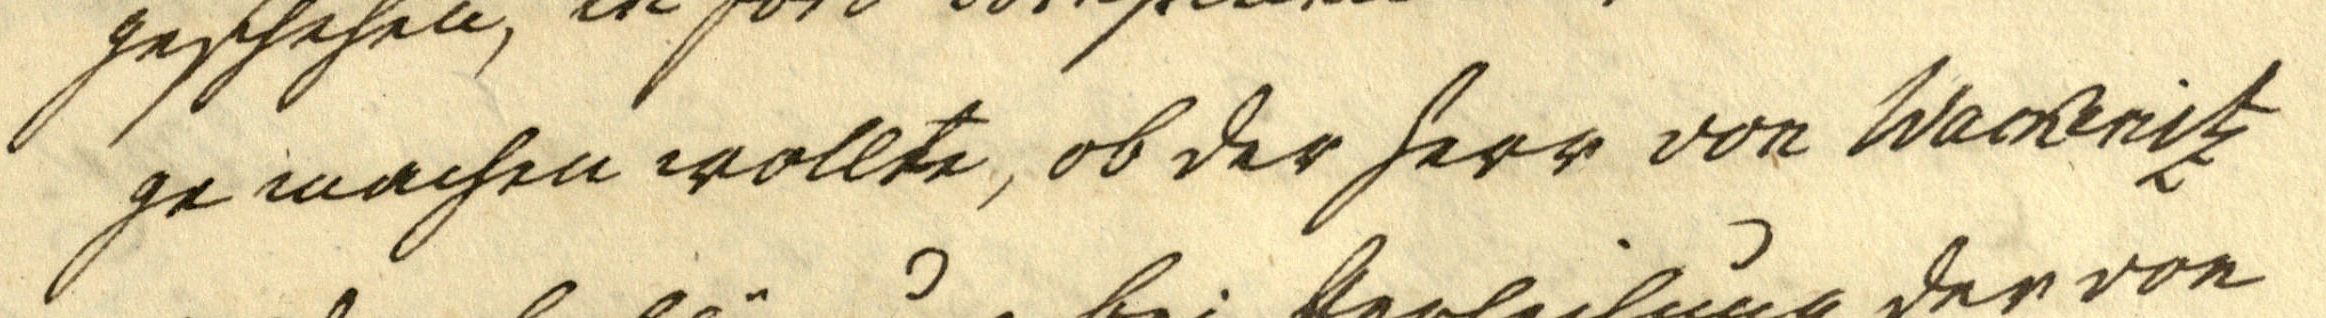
ge machen wollte, ob der Herr von Wackenitz
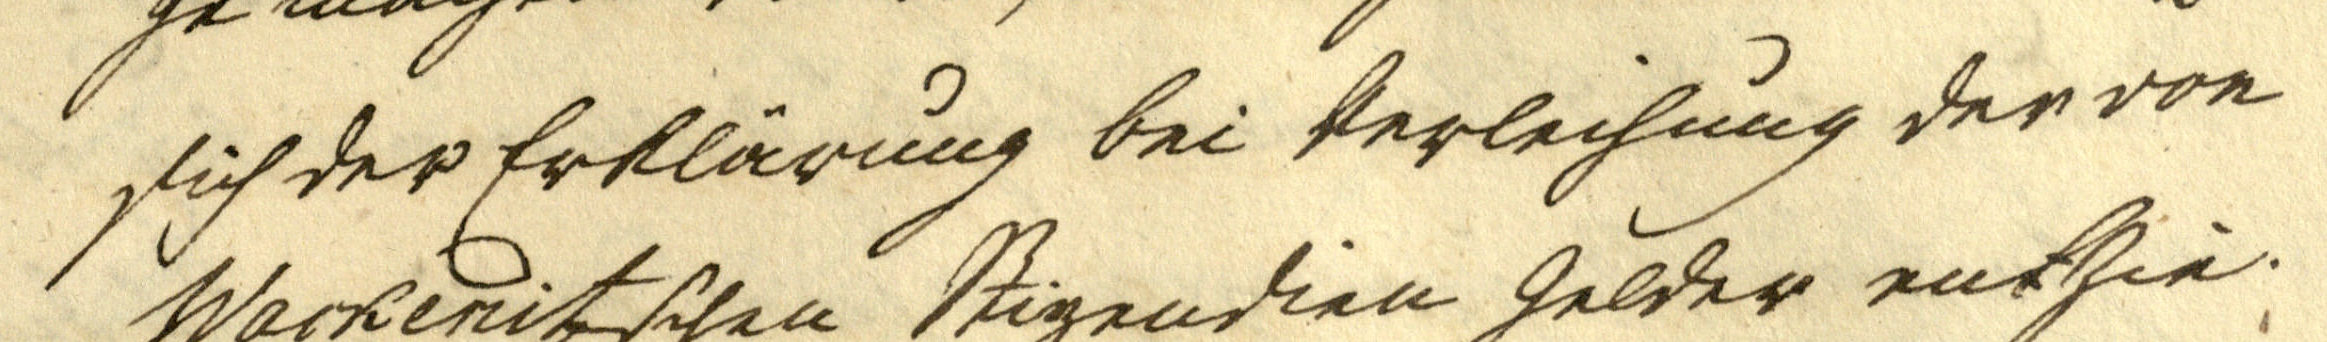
sich der Erklärung bei Verleihung der von
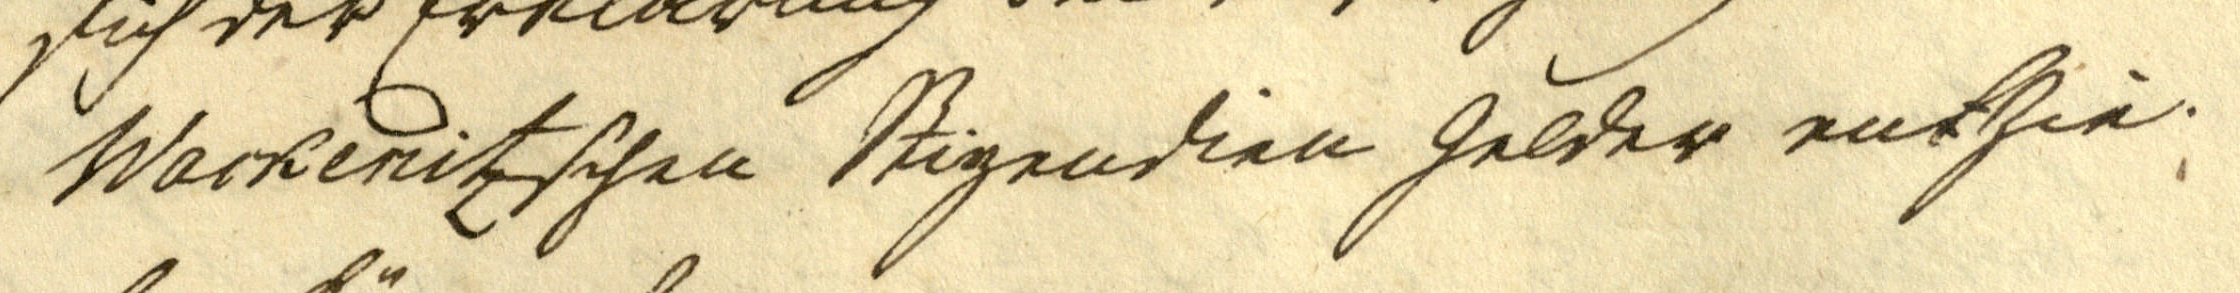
Wackenitzschen Stipendien Gelder entzie¬
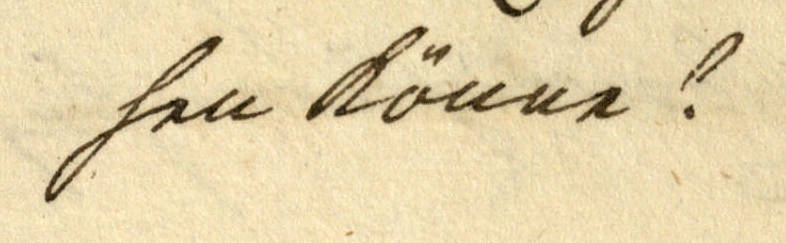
hen könne?
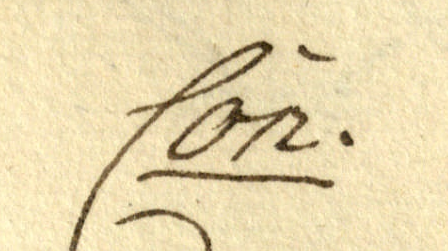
Con
